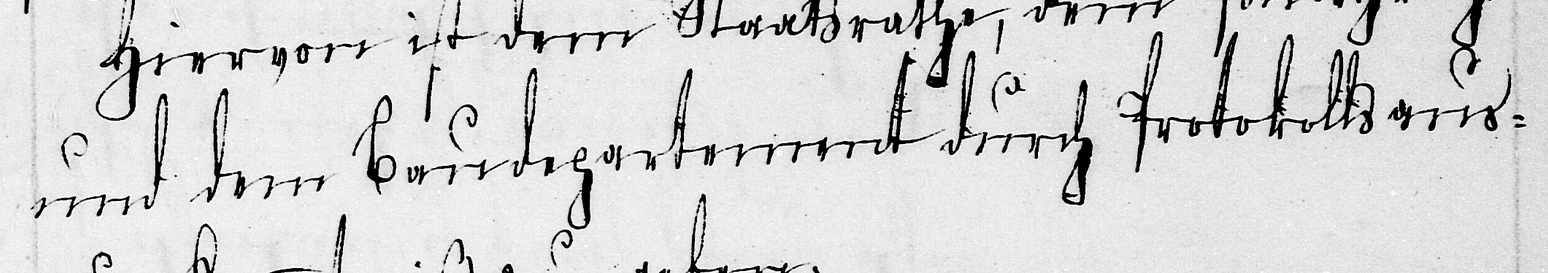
und dem Baudepartement durch Protokollsaus¬
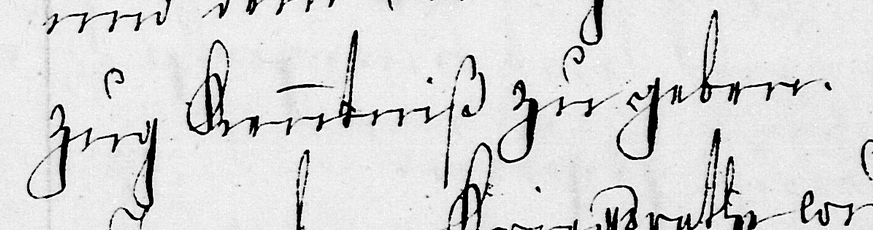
zug Kenntniß zu geben.
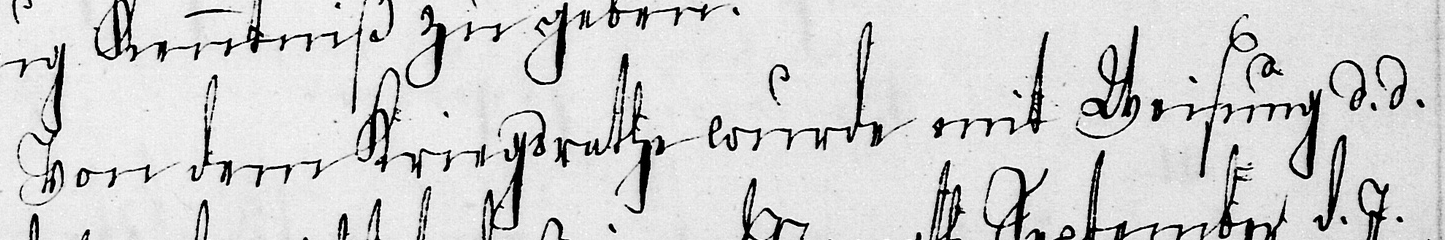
Von dem Kriegsrathe wurde mit Weisung d. d.
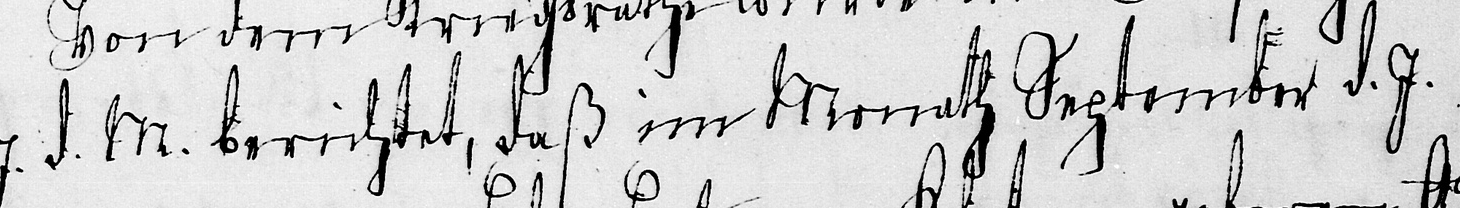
d. M. berichtet, daß im Monath September d. J.
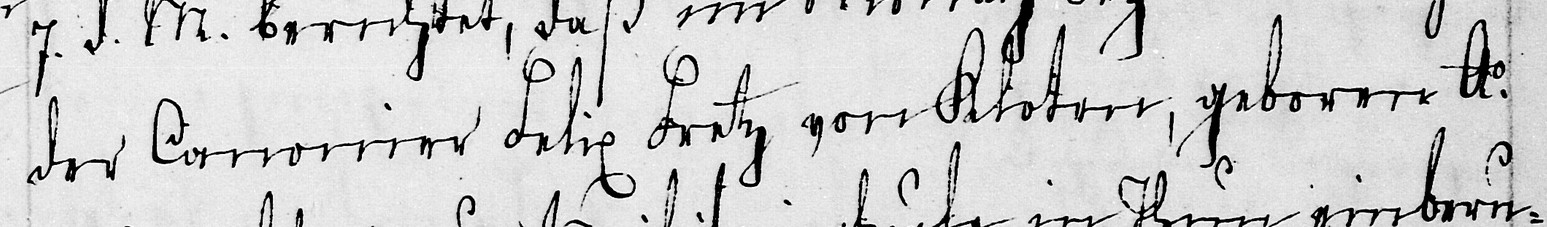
der Canonier Felix Fretz von Kloten, geboren Ao.
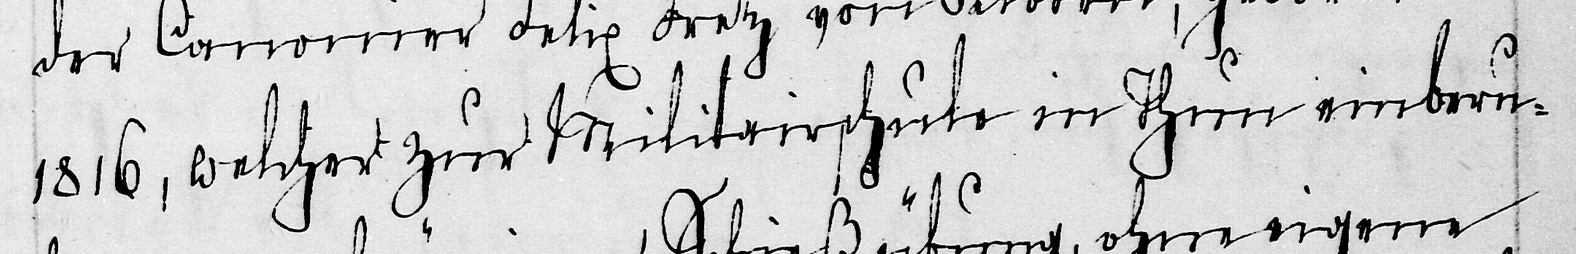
1816, welcher zur Militairschule in Thun einberu¬
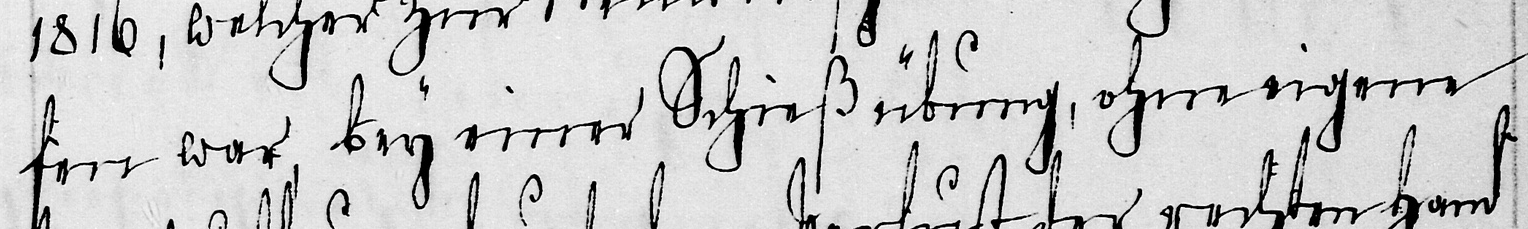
fen war, bey einer Schießübung, ohne eigene
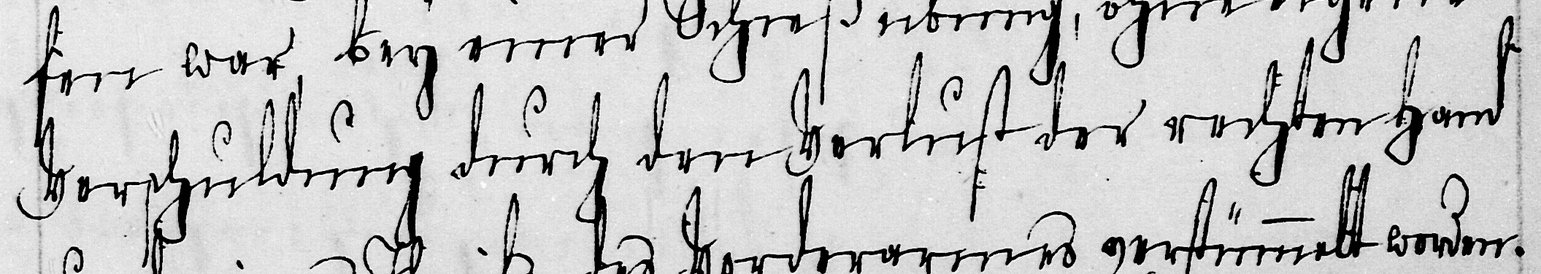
Verschuldung durch den Verlust der rechten Hand
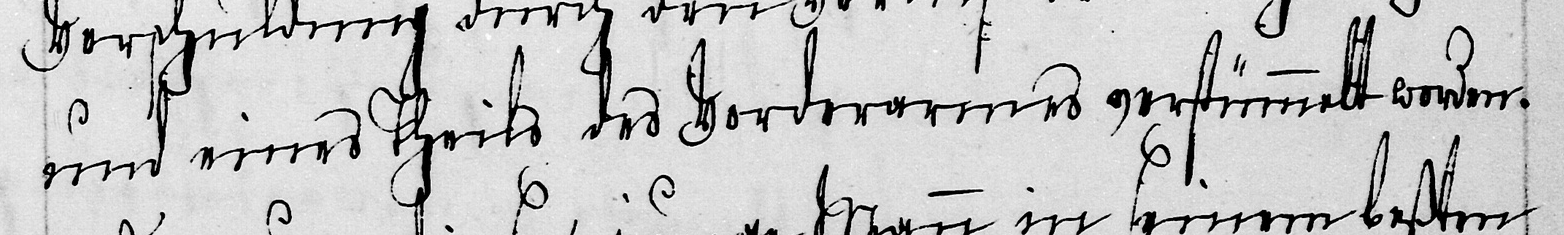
und eines Theils des Vorderarmes verstümmelt worden.
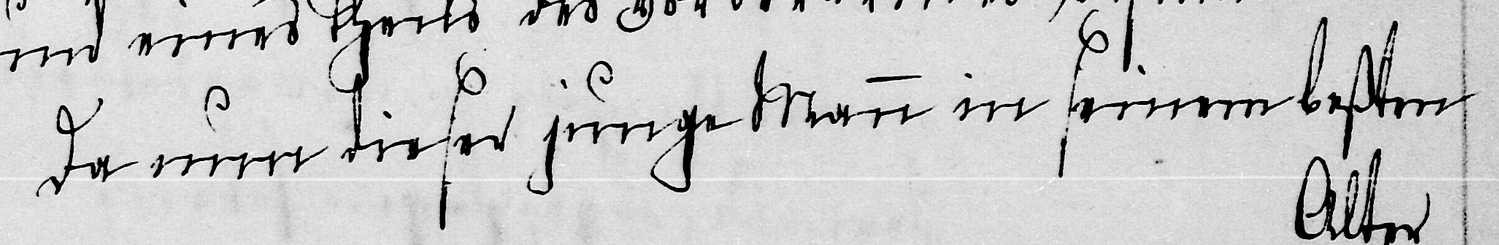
Da nun dieser junge Mann in seinem beßten
